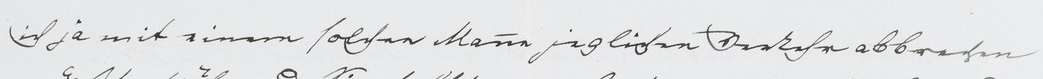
ich ja mit einem solchen Mann jeglichen Verkehr abbrechen
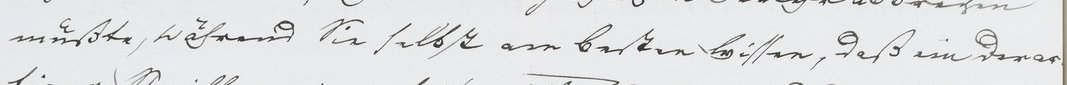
müßte, während Sie selbst am besten wissen, daß ein derar-
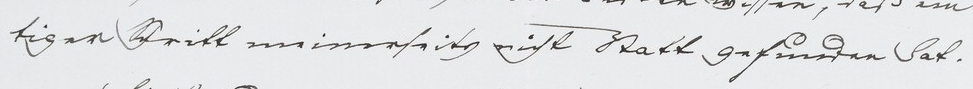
tiger Schritt meinerseits nicht Statt gefunden hat.
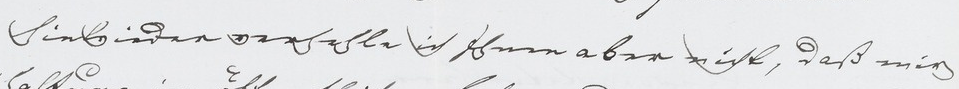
Hinwieder verhehle ich Ihnen aber nicht, daß mir
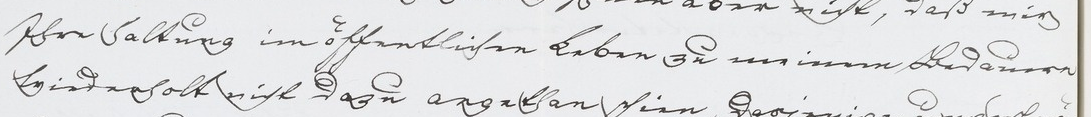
Ihre Haltung im öffentlichen Leben zu meinem Bedauern
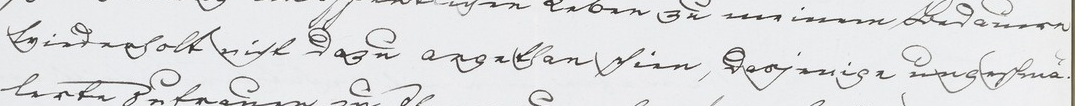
wiederholt nicht dazu angethan schien, dasjenige ungeschmä-
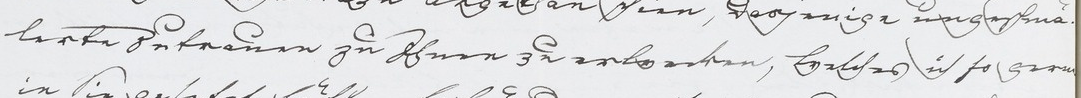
lerte Zutrauen zu Ihnen zu erwecken, welches ich so gerne
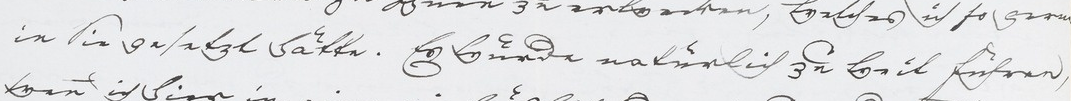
in Sie gesetzt hätte. Es würde natürlich zu weit führen,
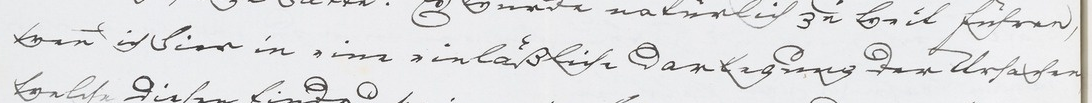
wenn ich hier in eine einläßliche Darlegung der Ursachen,
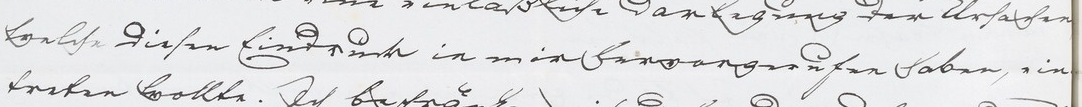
welche diesen Eindruck in mir hervorgerufen haben, ein-
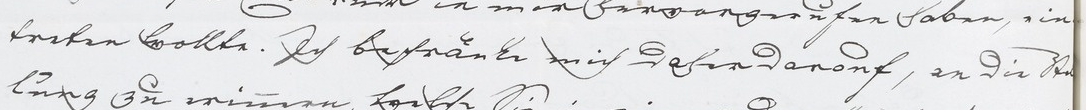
treten wollte. Ich beschränke mich daher darauf, an die Stel-
